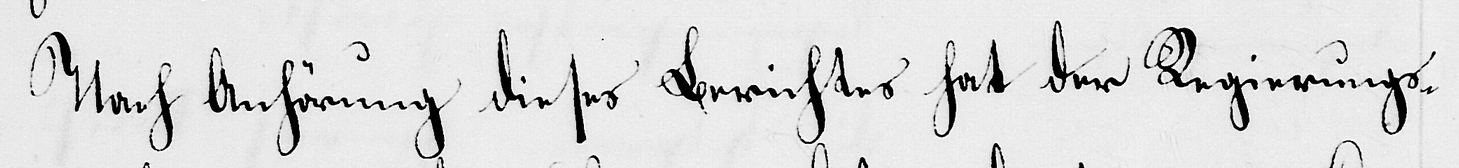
Nach Anhörung dieses Berichtes hat der Regierungs¬
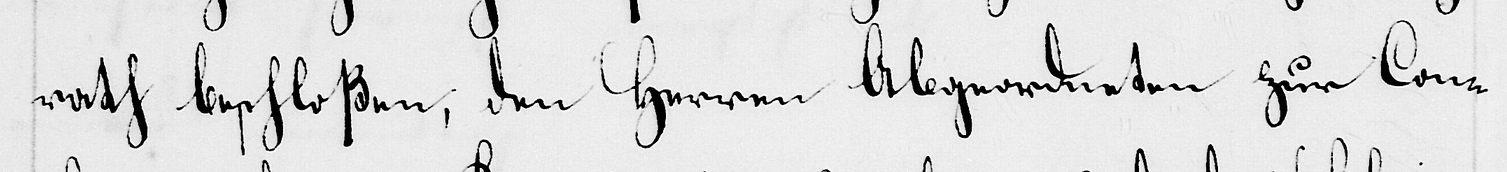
rath beschloßen, den Herren Abgeordneten zur Con¬
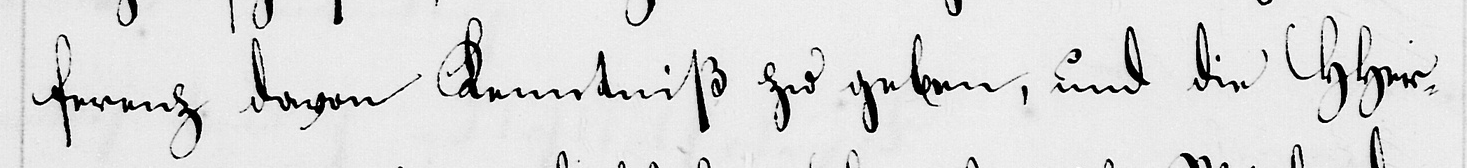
ferenz davon Kenntniß zu geben, und die HHer¬
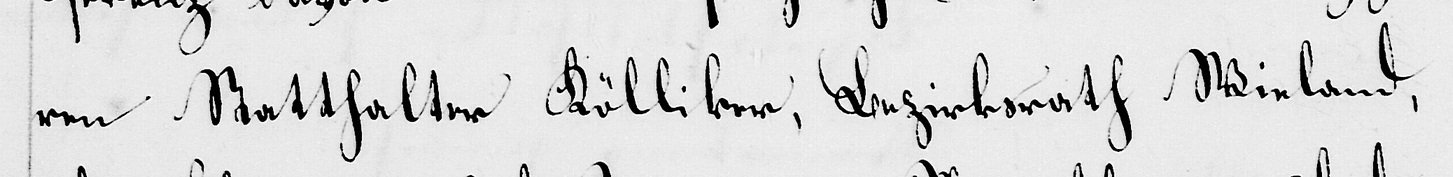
ren Statthalter Kölliker, Bezirksrath Wieland,
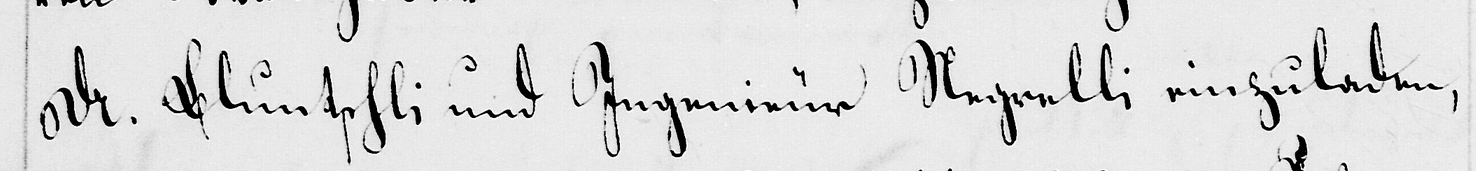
Dr. Bluntschli und Ingenieur Negrelli einzuladen,
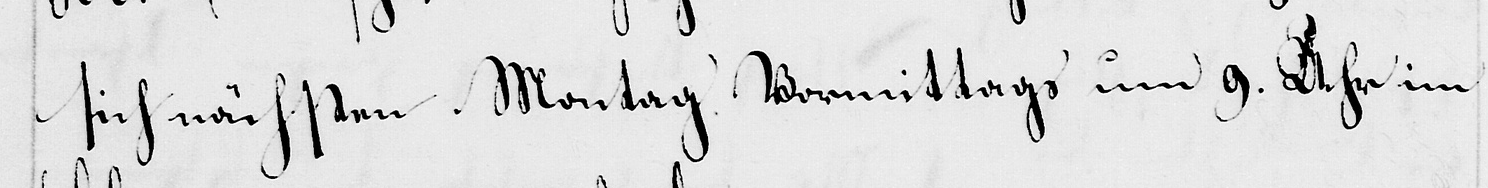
sich nächsten Montag Vormittags um 9. Uhr im
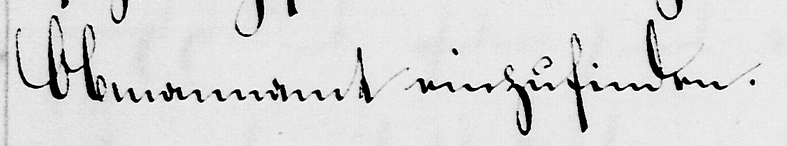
Obmannamt einzufinden.
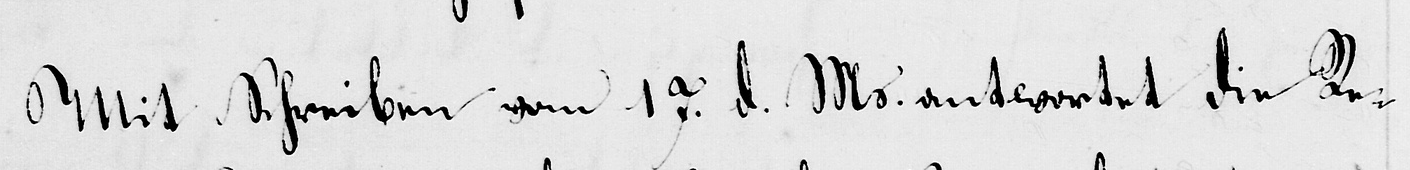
Mit Schreiben vom 17. d. Ms. antwortet die Re¬
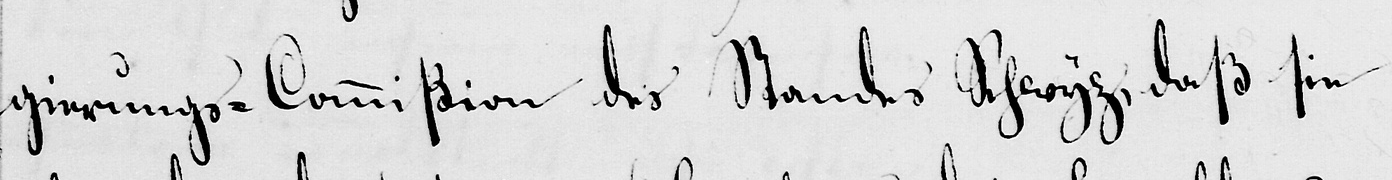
gierungs-Commißion des Standes Schwyz, daß sie
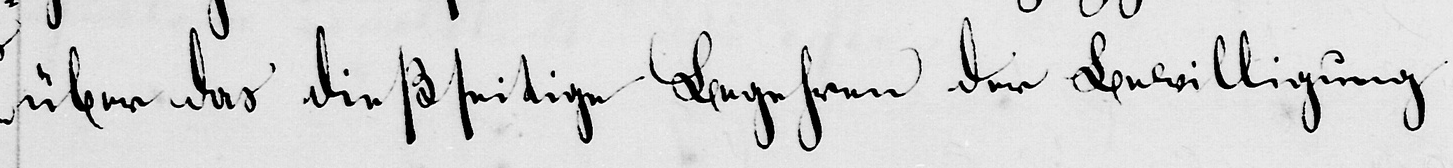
über das dießseitige Begehren der Bewilligung
